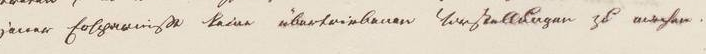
jener Ersparniße keine übertriebenen Vorstellungen zu machen.
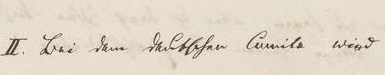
II. Bei dem deutschen Comite wird
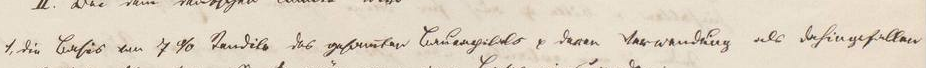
1. die Basis von 7% Rendite des gesammten Baucapitals & deren Verwendung als dahingefallen
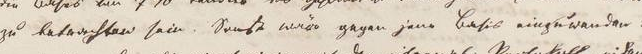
zu betrachten sein. Sonst wäre gegen jene Basis einzuwenden:
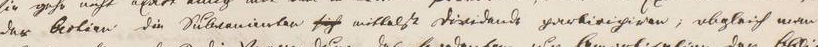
der Actien die Subvenienten sich mittelst Dividende participiren; obgleich man
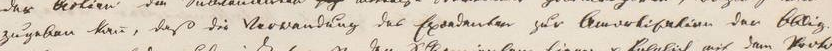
zugeben kann, daß die Verwendung des Excedenten zur Amortisation der Oblig. -
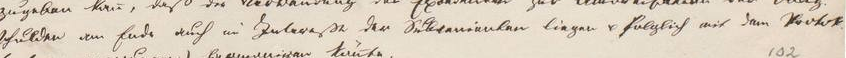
schulden am Ende auch im Intereße der Subvenienten liegen & folglich mit dem Protok.
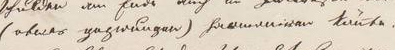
(etwas gezwungen) harmoniren könnte.
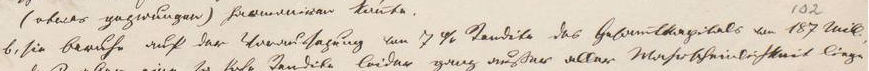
b. sie beruhe auf der Voraussezung von 7% Rendite des Gesammtkapitals von 187 Mill.
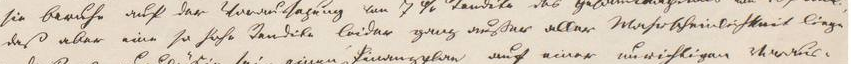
daß aber eine so hohe Rendite leider ganz außer aller Wahrscheinlichkeit liege
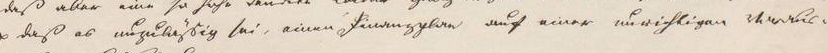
& daß es unzuläßig sei, einen Finanzplan auf einer unrichtigen Voraus-
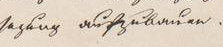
sezung aufzubauen.
